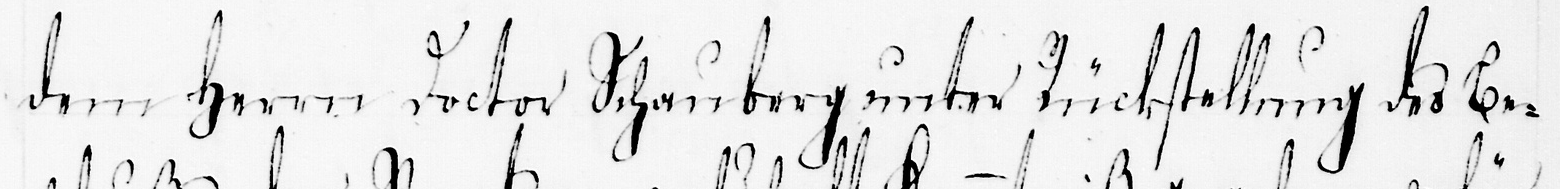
dem Herrn Doctor Schauberg unter Rückstellung des Be¬
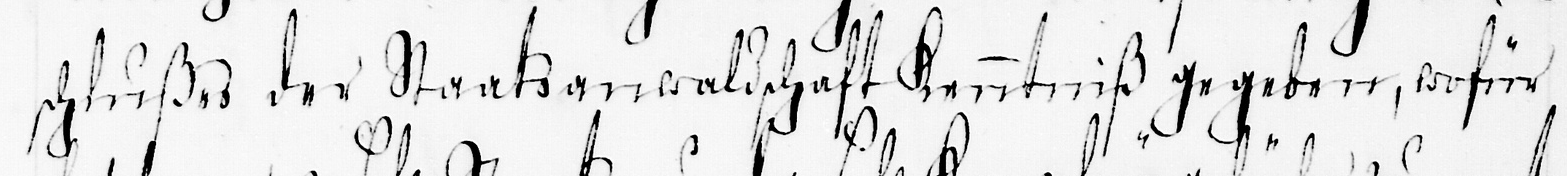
schlußes der Staatsanwaldschaft Kenntniß gegeben, wofür
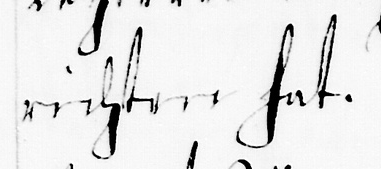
richten hat.
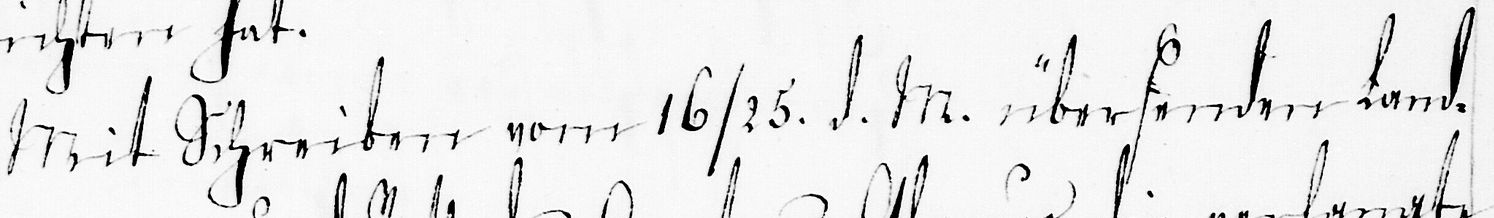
Mit Schreiben vom 16/25. d. M. übersenden Land¬
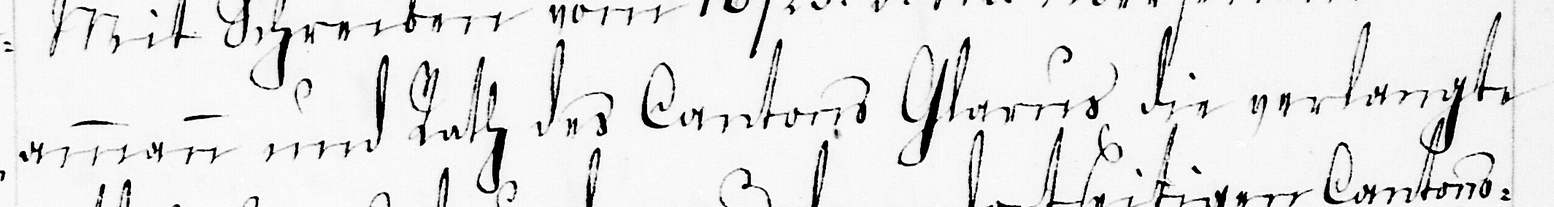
ammann und Rath des Cantons Glarus die verlangte
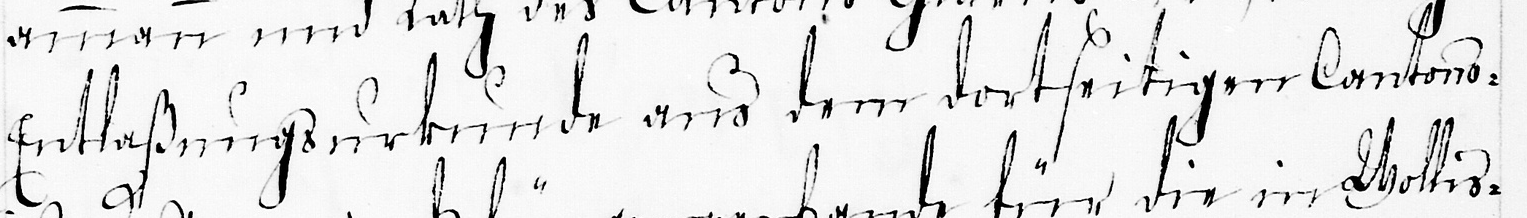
Entlaßungsurkunde aus dem dortseitigen Cantons-
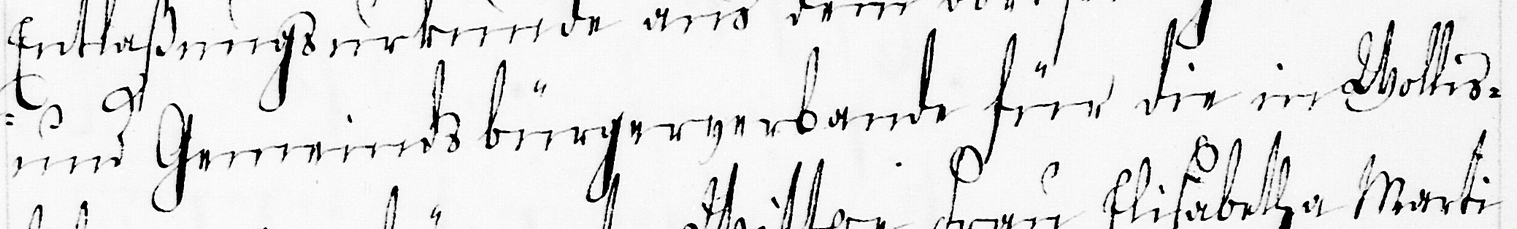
und Gemeindsbürgerverbande für die in Wollis¬
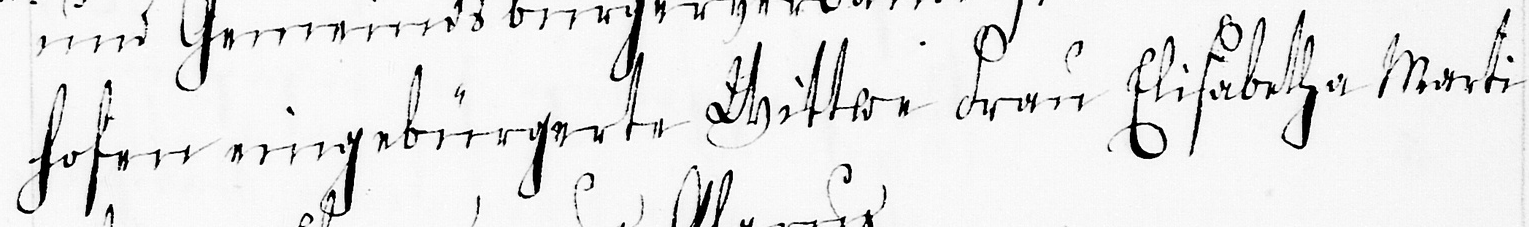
hofen eingebürgerte Wittwe Frau Elisabetha Marti
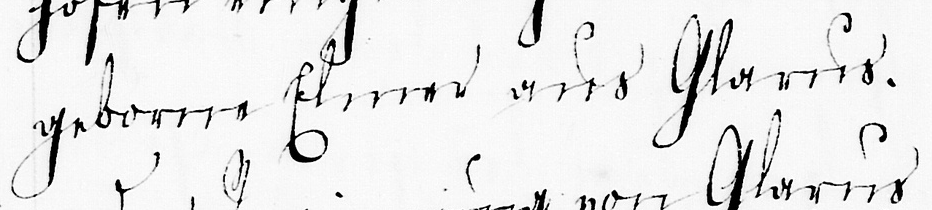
geborne Elmer aus Glarus.
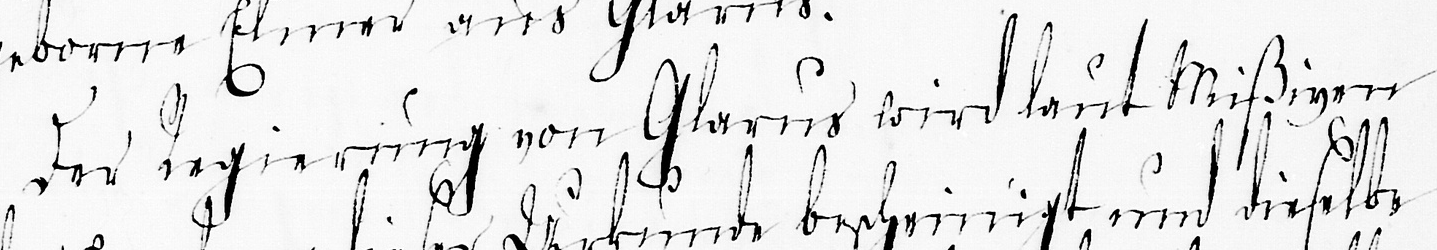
Der Regierung von Glarus wird laut Mißiven
